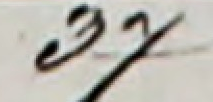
37
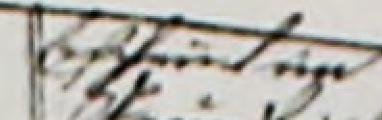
Esseint im
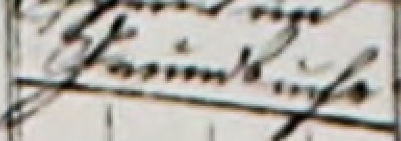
Grundbuche
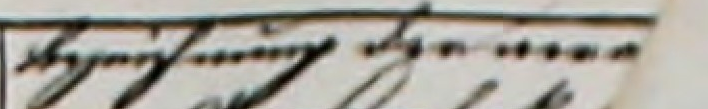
Bezeichnung der erarischen
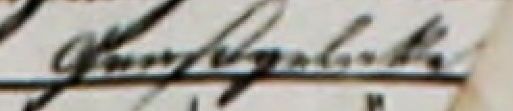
Graßgelake
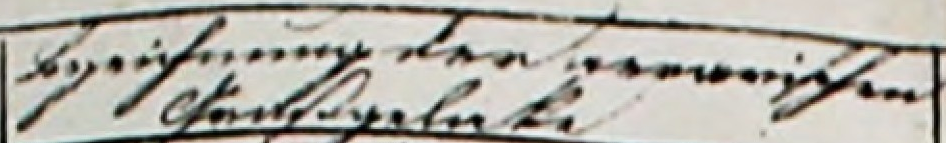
Bezeichnung der erarischen
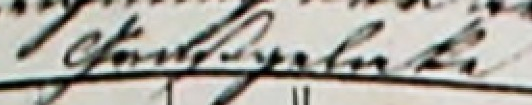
Graßgelake
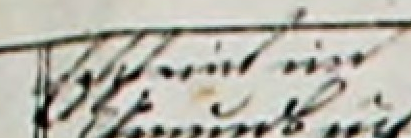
Esseint im
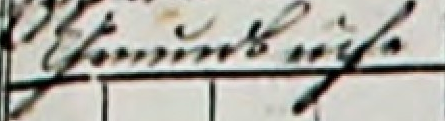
Grundbuche
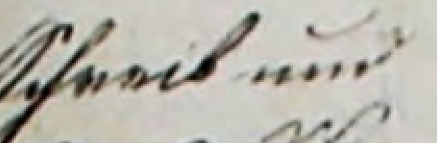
Schreib und
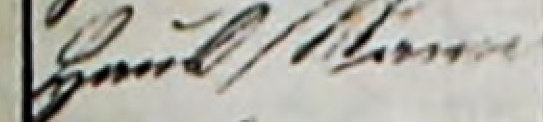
Haus Name
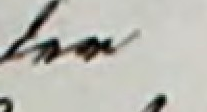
der
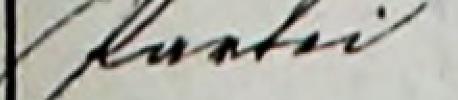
Partei.
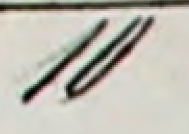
10
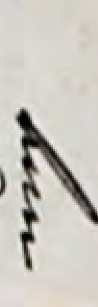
ung
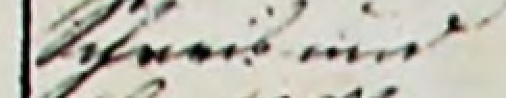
Schreib und
